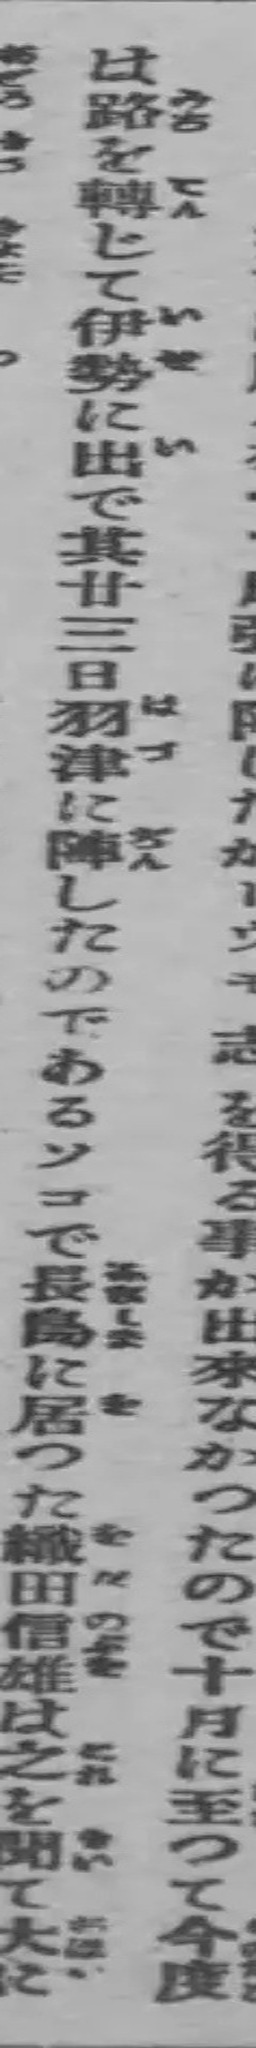は路を転じて伊勢に出で其廿三日羽津に陣したのであるソコで長島に居つた織田信雄は之を聞いて大に
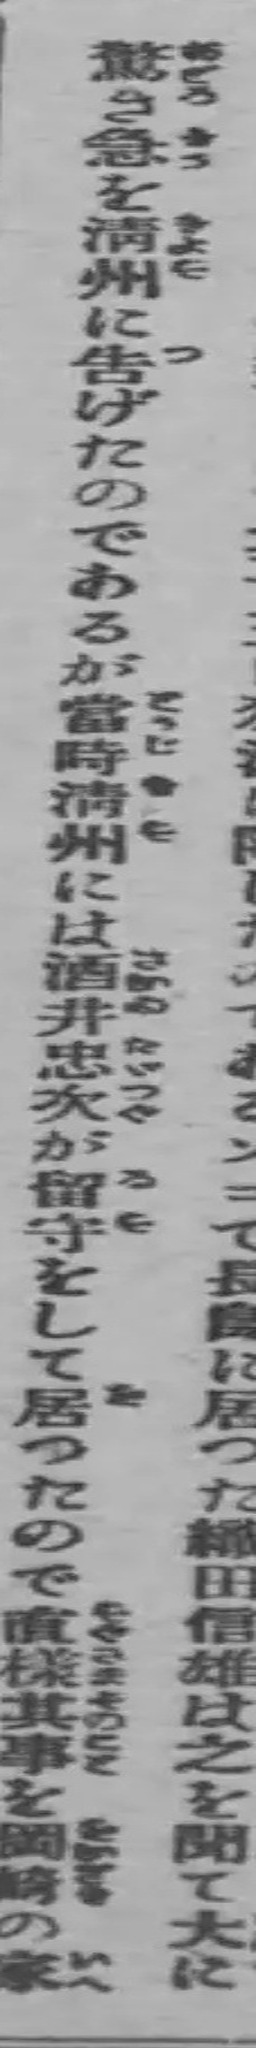驚き急を清洲に告げたのであるが当時清洲には酒井忠次が留守をして居つたので直様其事を岡崎の家
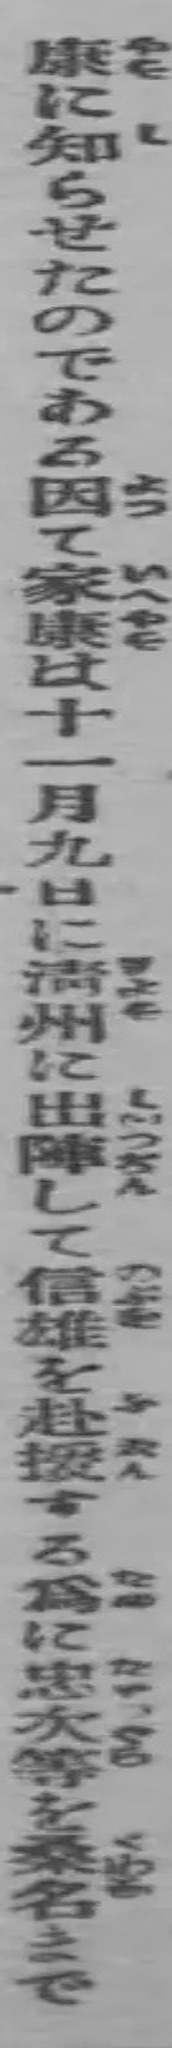康に知らせたのである因て家康は十一月九日に清洲に出陣して信雄を赴援する為に忠次等を桑名まで
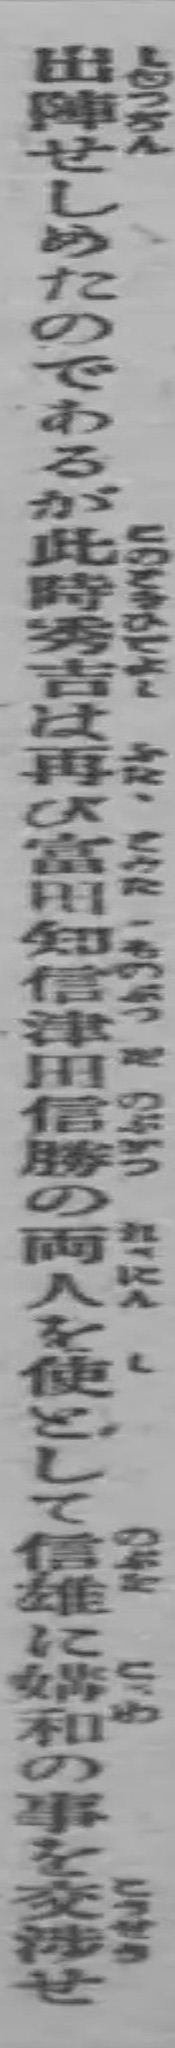出陣せしめたのであるが此時秀吉は再び富田知信津田信勝の両人を使として信雄に媾和の事を交渉せ
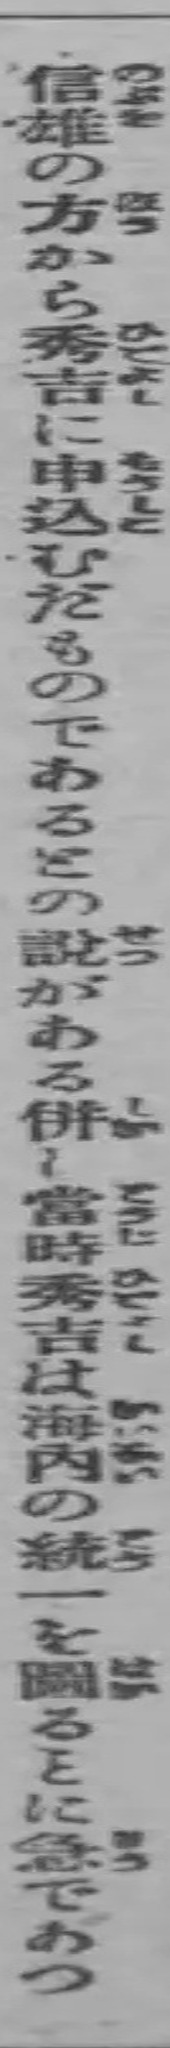信雄の方から秀吉に申込むだものであるとの説がある併し当時秀吉は海内の統一を図ることに急であつ
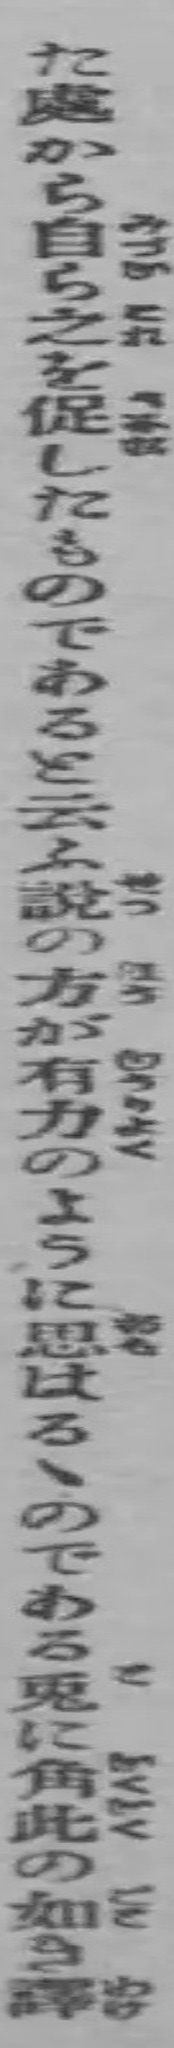た処から自ら之を促したものであると云ふ説の方が有力のように思はるゝのである兎に角此の如き訳
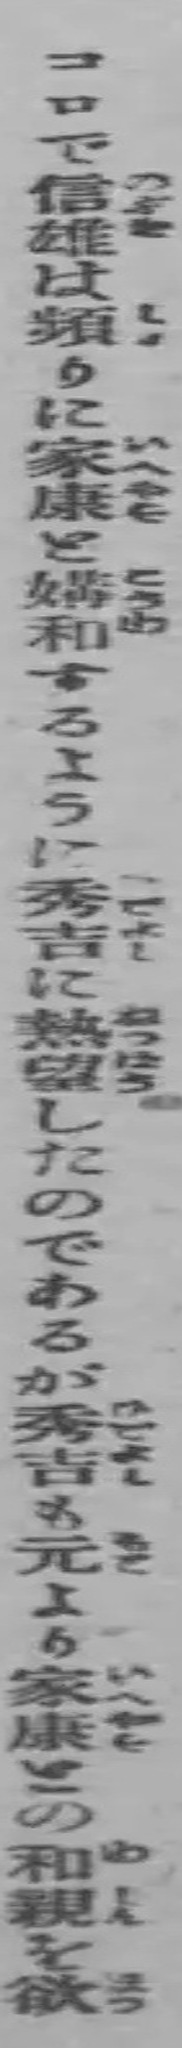コロで信雄は頻りに家康と媾和するように秀吉に熱望したのであるが秀吉も元より家康との和親を欲
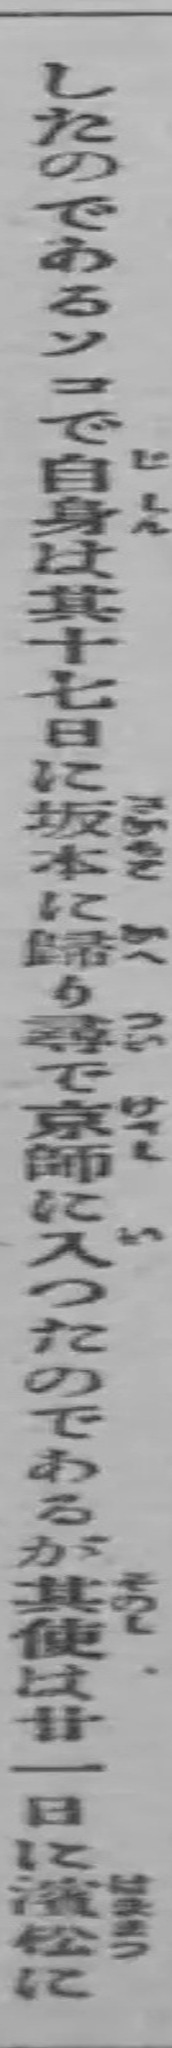したのであるソコで自身は其十七日に坂本に帰り尋で京師に入つたのであるが其使は廿一日に浜松に
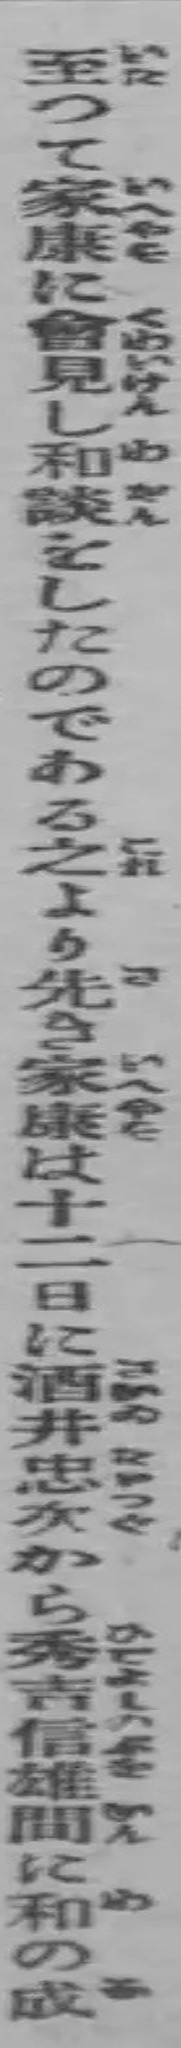至つて家康に会見し和談をしたのである之より先き家康は十二日に酒井忠次から秀吉信雄間に和の成
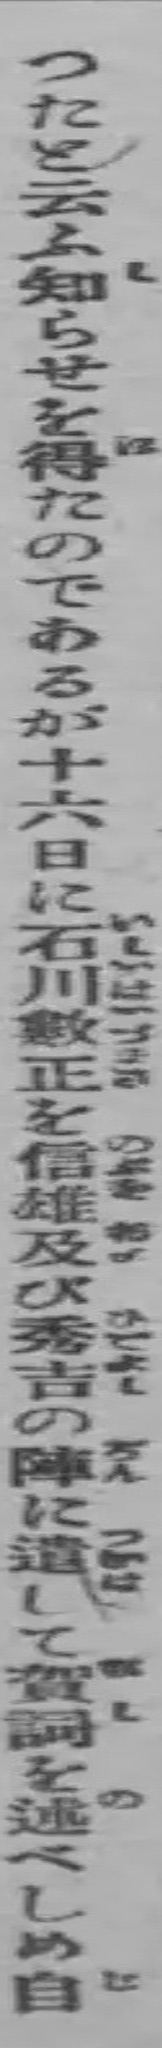つたと云ふ知らせを得たのであるが十六日に石川数正を信雄及び秀吉の陣に遣して賀詞を述べしめ自
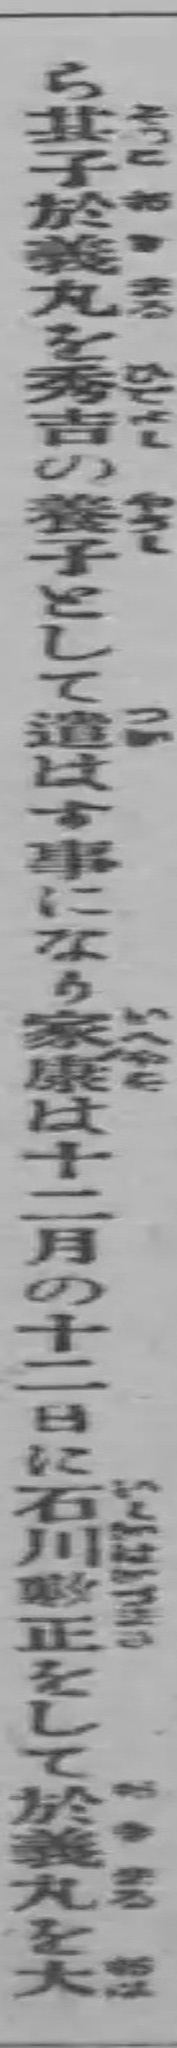ら其子於義丸を秀吉の養子として遣はす事になり家康は十二月の十二日に石川数正をして於義丸を大
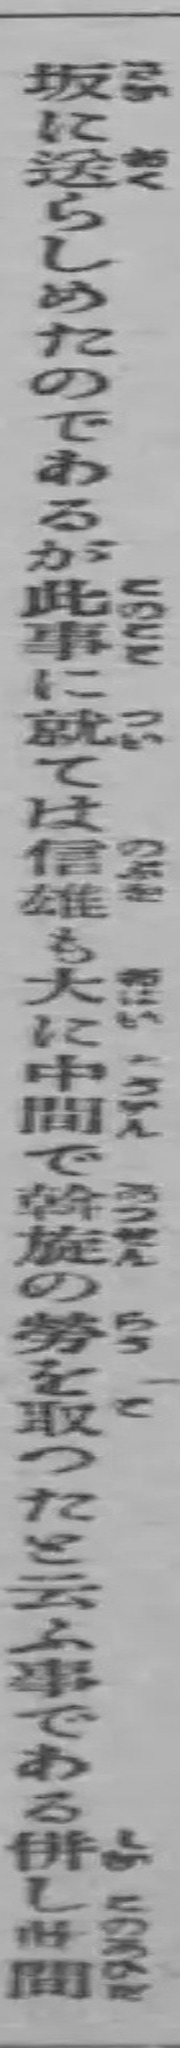坂に送らしめたのであるが此事に就ては信雄も大に中間で斡旋の労を取つたと云ふ事である併し此間
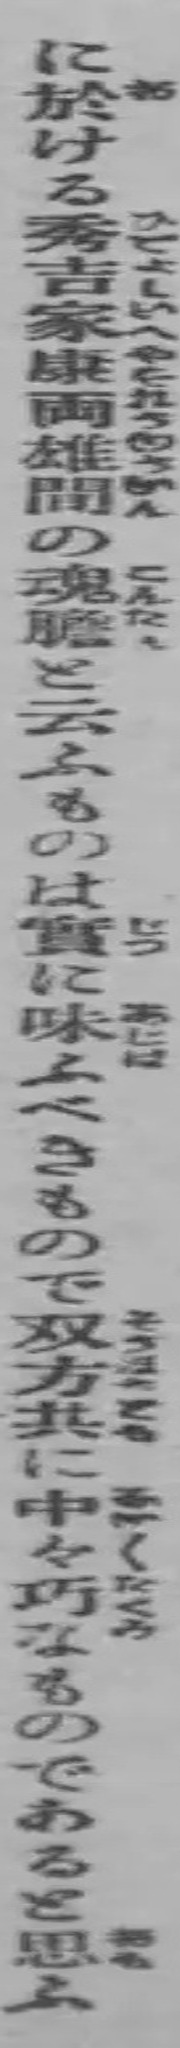に於ける秀吉家康両雄間の魂胆と云ふものは実に味ふべきもので双方共に中々巧なものであると思ふ
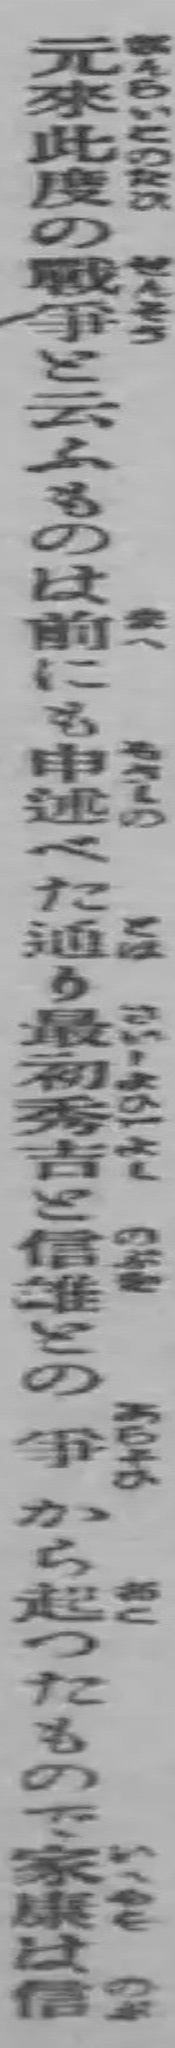両雄の計策元来此度の戦争と云ふものは前にも申述べた通り最初秀吉と信雄との争から起つたもので家康は信
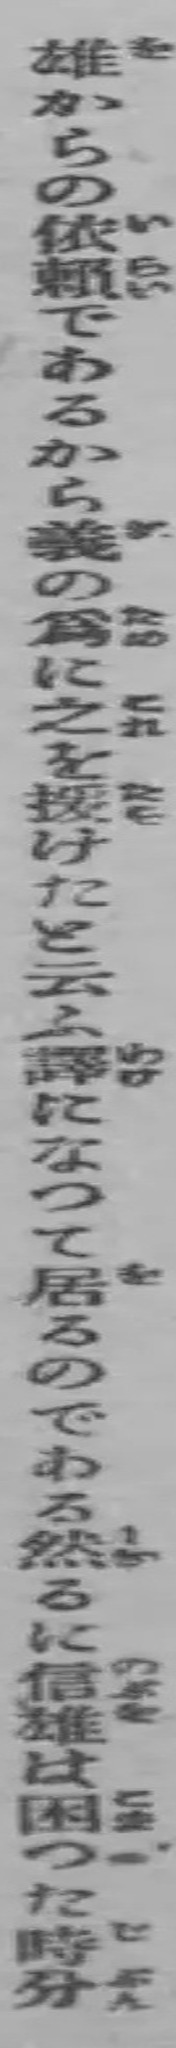雄からの依頼であるから義の為に之を援けたと云ふ訳になつて居るのである然るに信雄は困つた時分
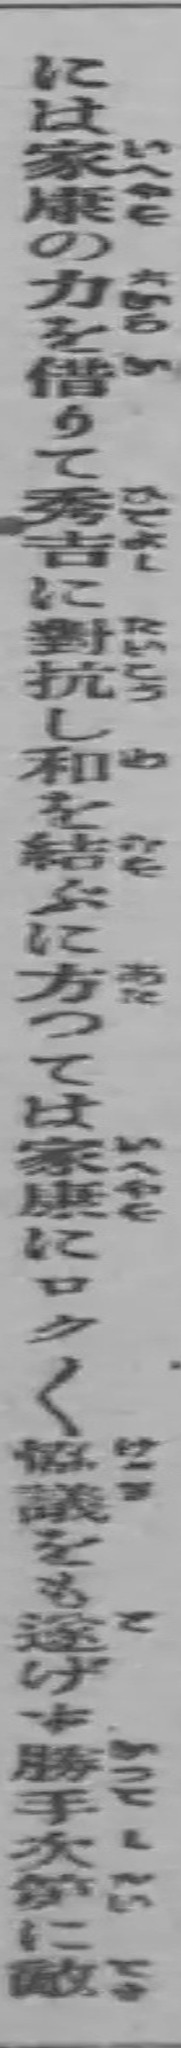には家康の力を借りて秀吉に対抗し和を結ぶに方つては家康にロク〳〵協議をも遂げず勝手次第に敵
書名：豊橋市史談
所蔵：国立国会図書館 National Diet Library, JAPAN
